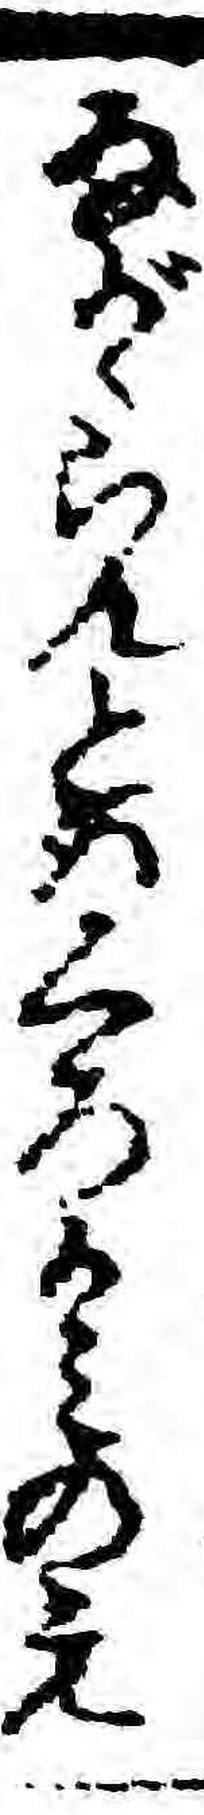ながゝらんとはくろかみのえ
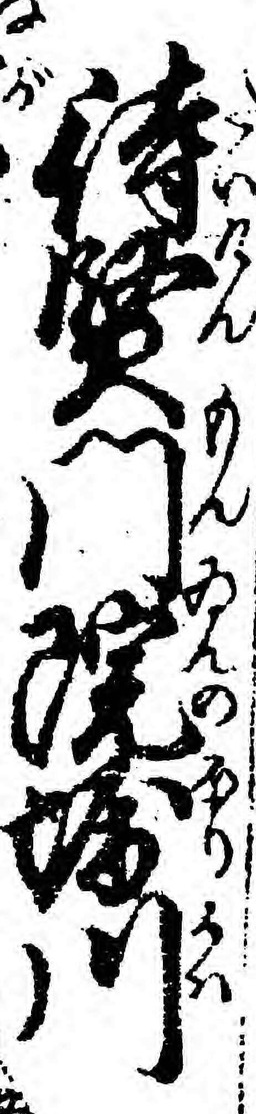待賢門院堀川
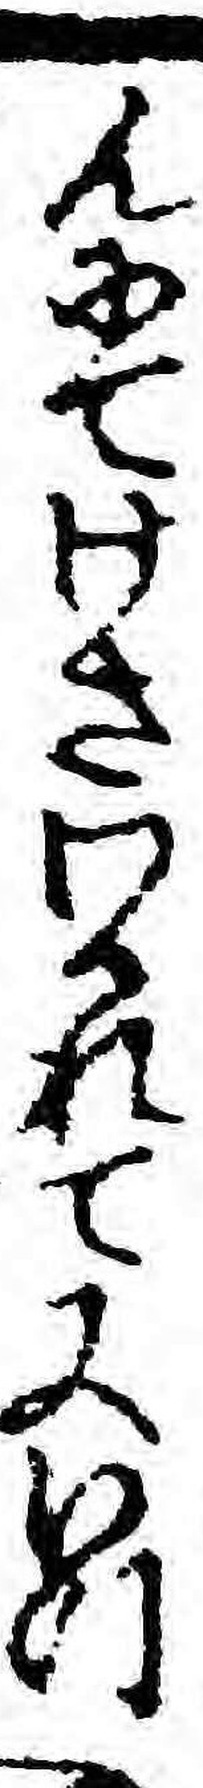んにてけさわかれて又いつ
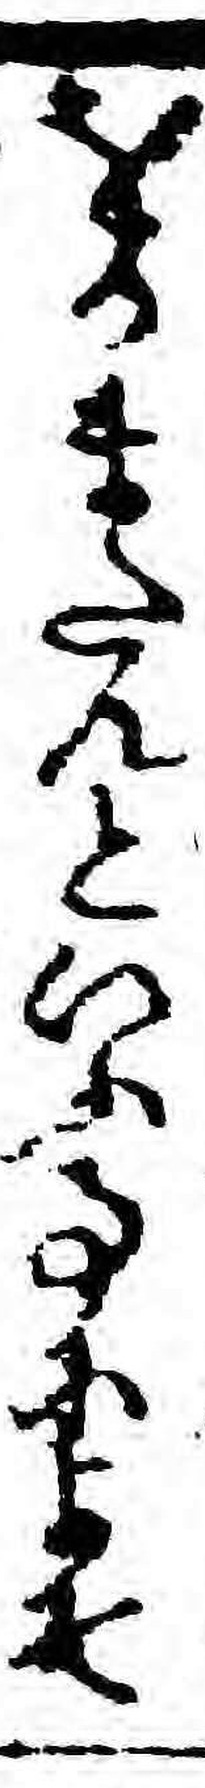をかまたんといふ事によそ
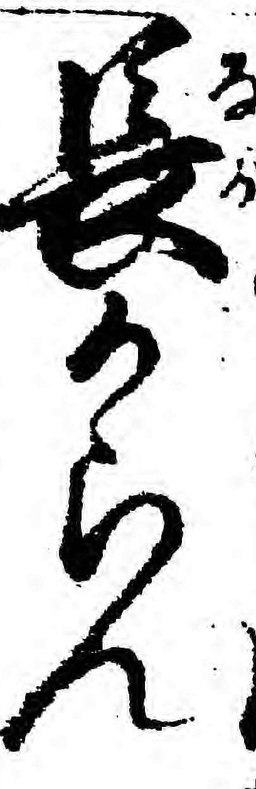長からん
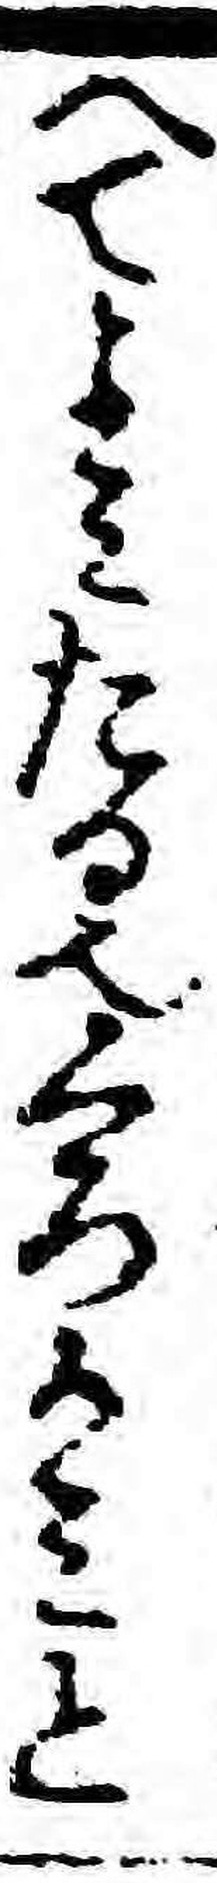へてよみたる也くろかみと
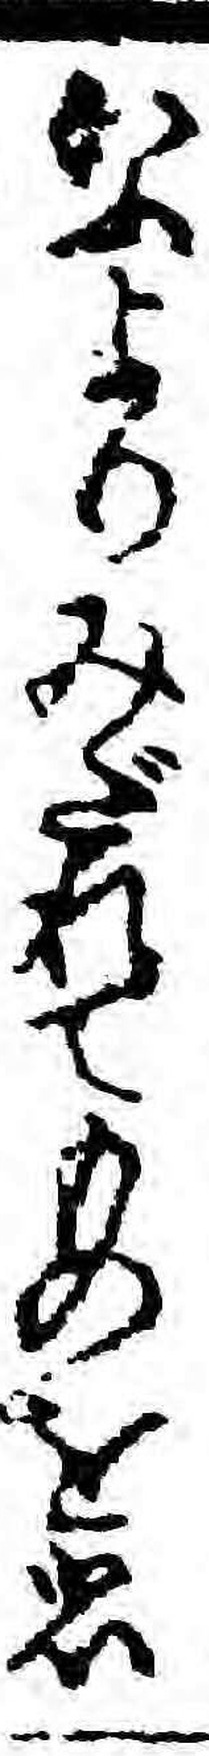いふよりみだれてものを思
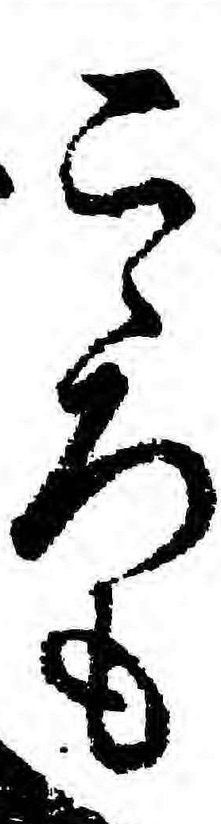こゝろも
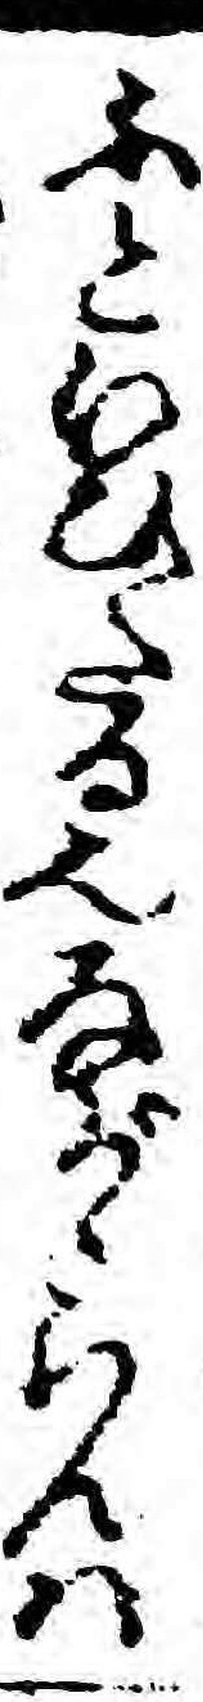ふといひたる也ながゝらんは
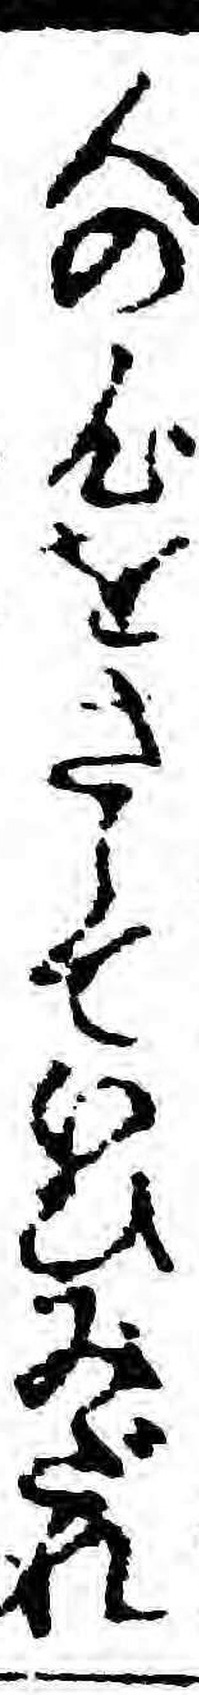人の心をさしていひみだれ
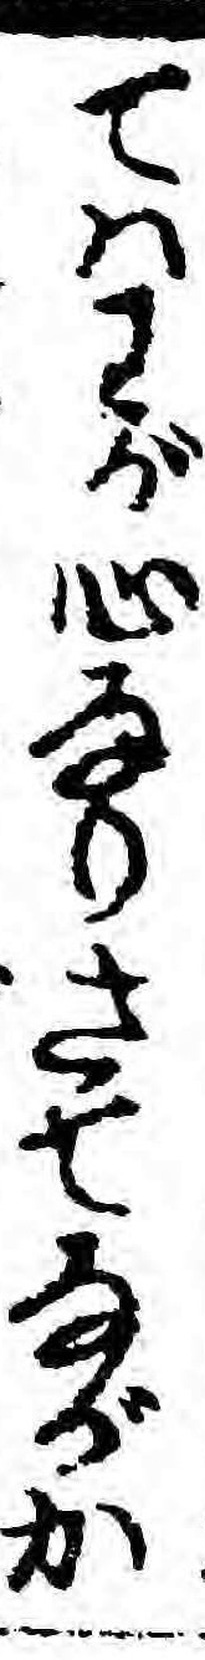てはわが心なりさそながか
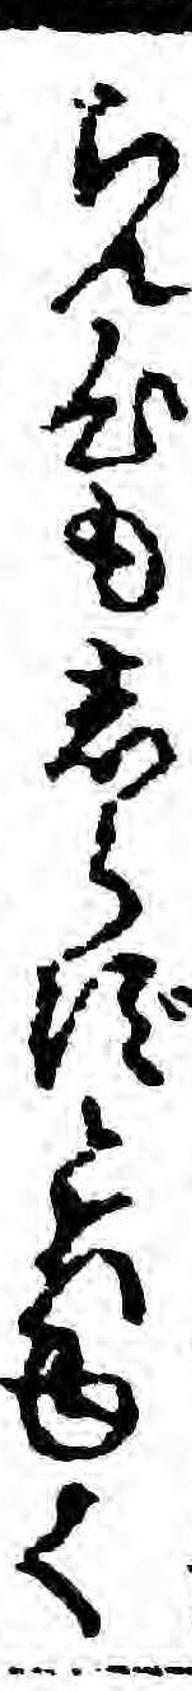らん心もしらずとはゆく
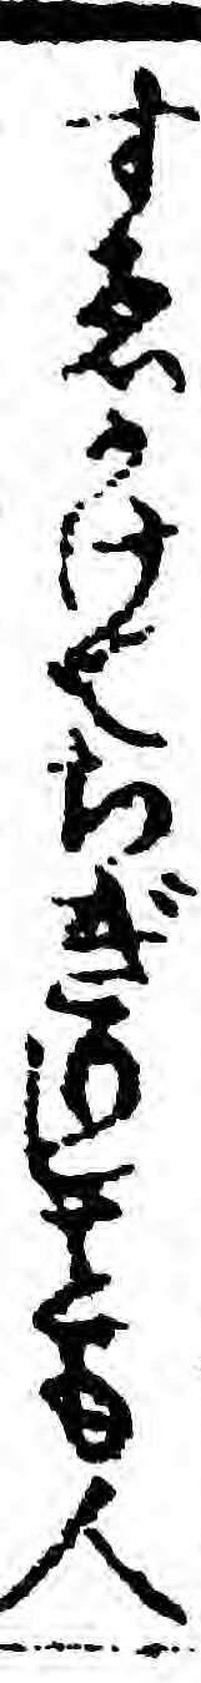すゑかけてちぎりしことも人
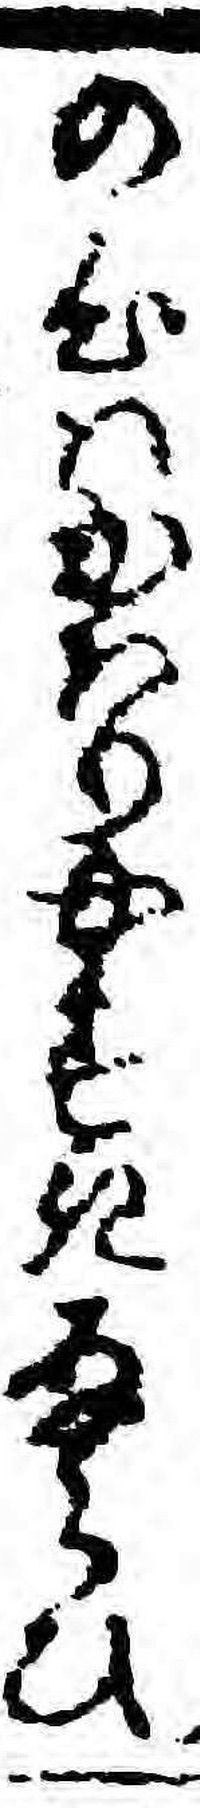の心はかはりやすきならひ
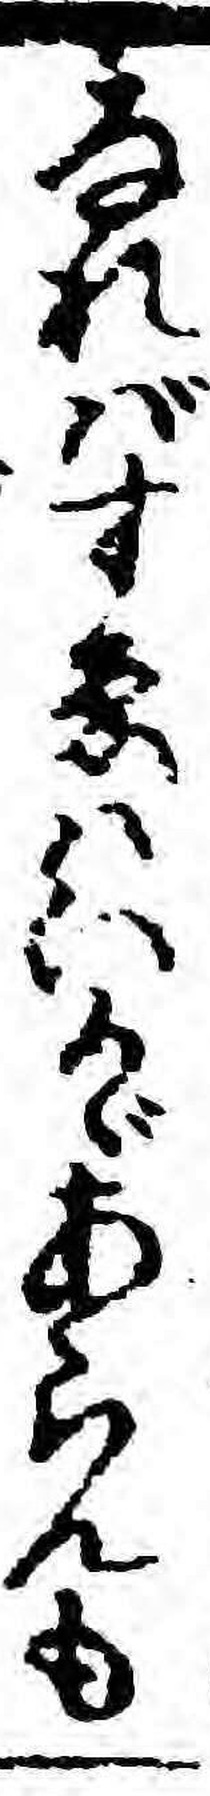なればすゑはいかゞあらんも
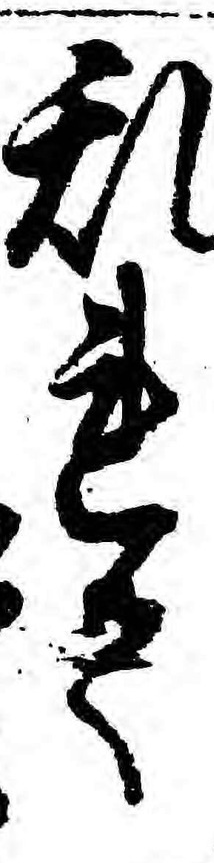乱れて
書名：頭書和歌注譯／壽賀多百人一首小倉錦
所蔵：国文学研究資料館
